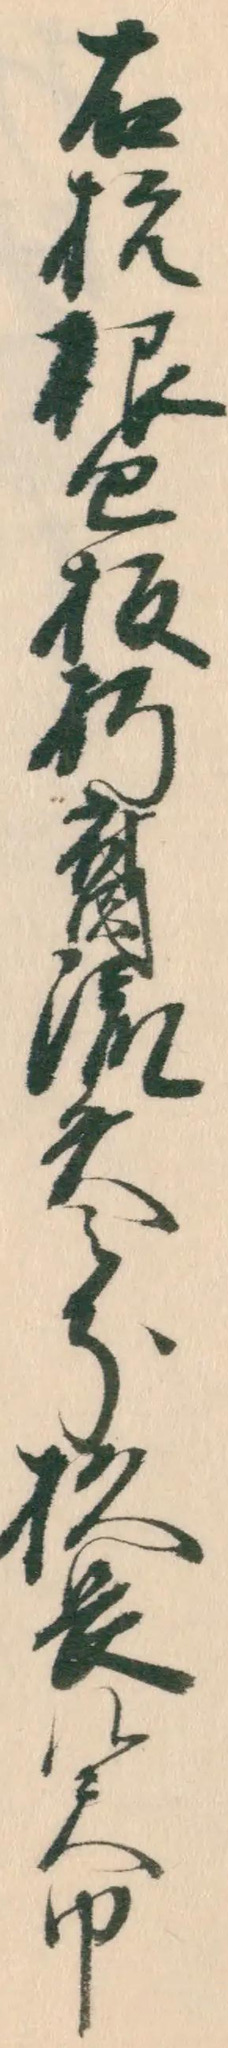右杭根包板朽腐流失之分杉長八尺巾
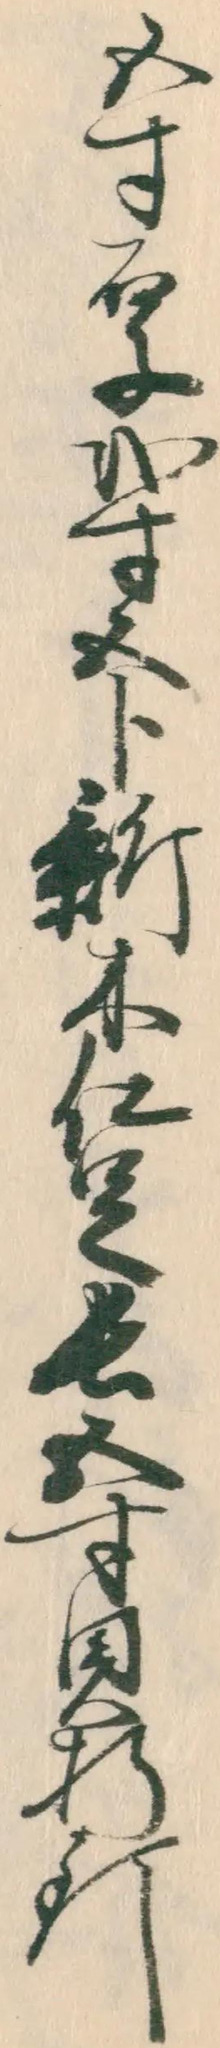五寸厚弐寸五分新木仕足長五寸貝折釘
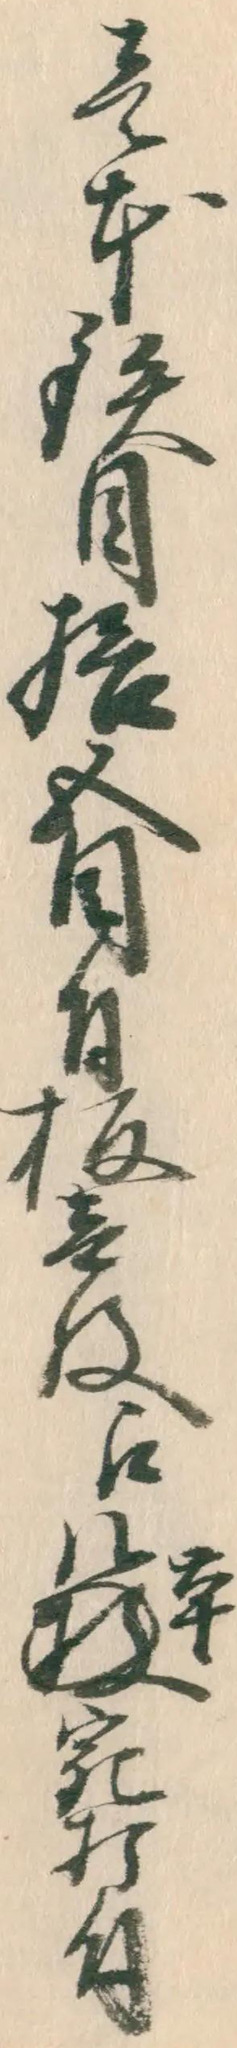壱本鉄目拾五目付板壱枚え八「枚」本宛打付
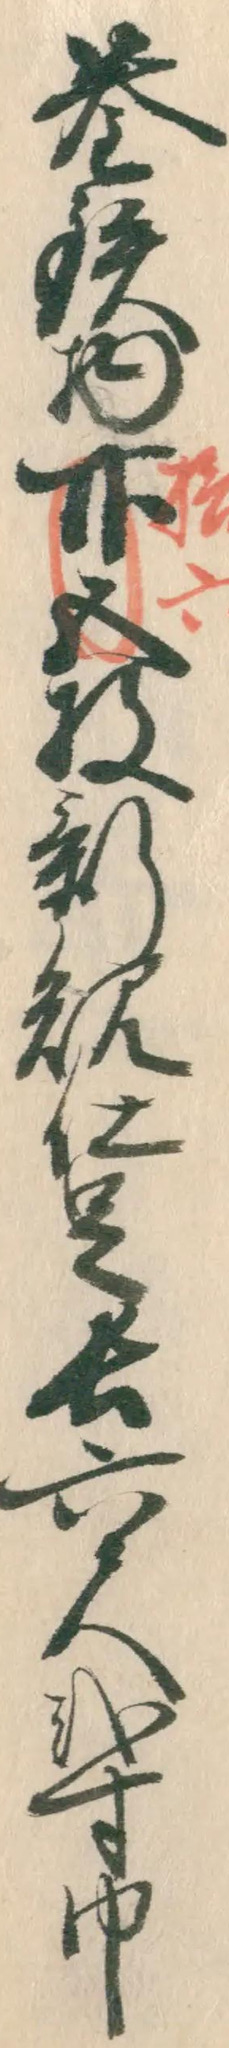巻鉄物「廿五」枚新規仕足長六尺弐寸巾

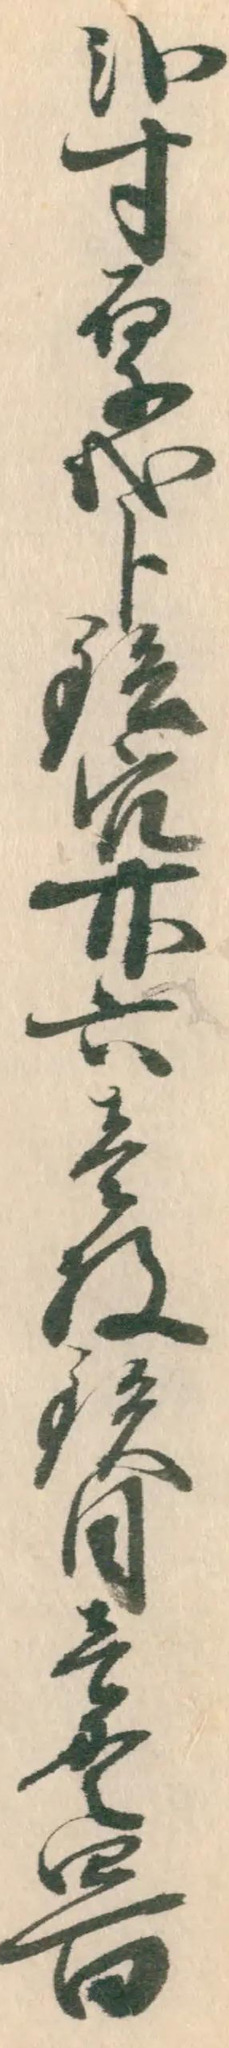弐寸厚弐分鋲穴廿六壱枚鉄目壱貫四百
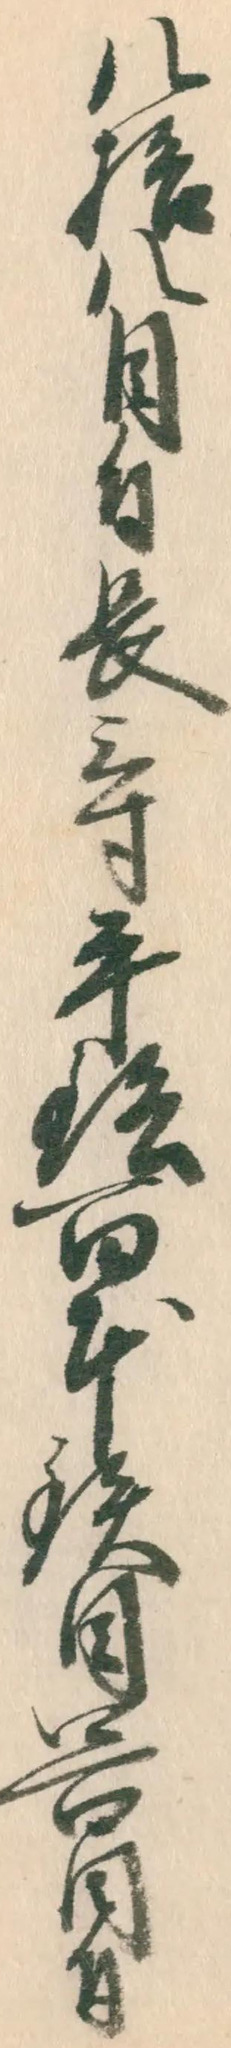八拾八目付長三寸平鋲百本鉄目四百目付
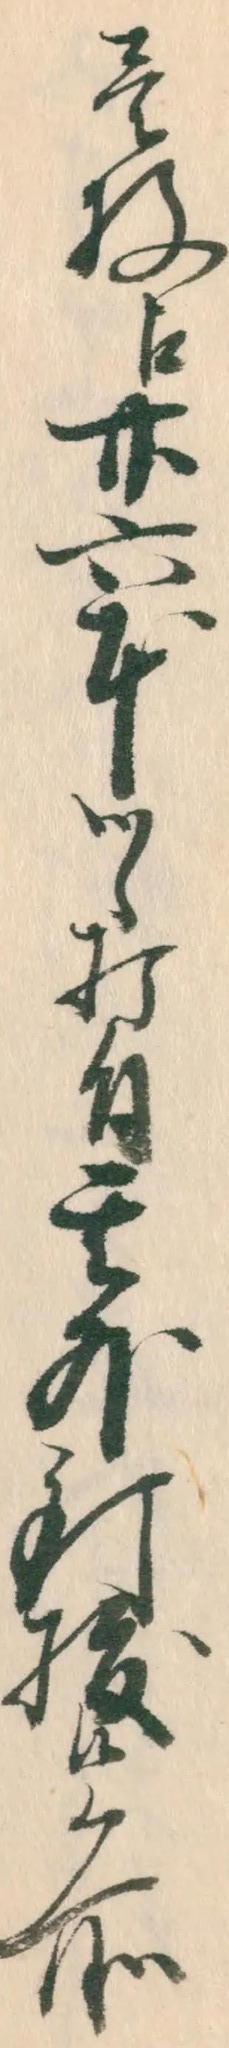壱枚え廿六本ツヽ打付其外釘抜候ケ所
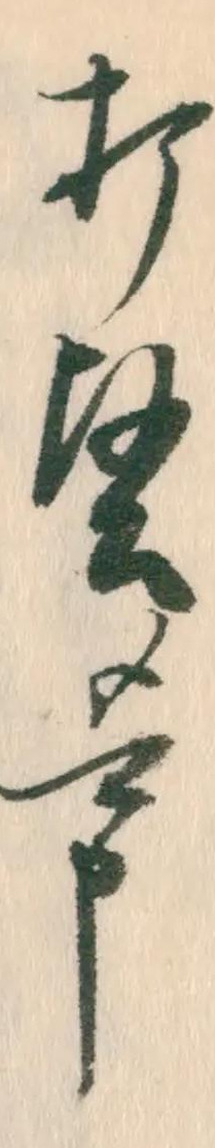打堅メ可申
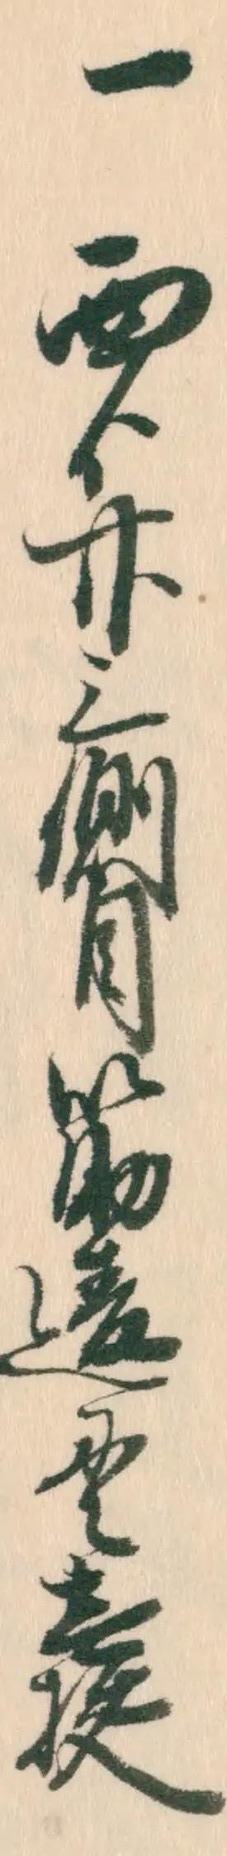一西ゟ廿三側目筋違貫壱挺
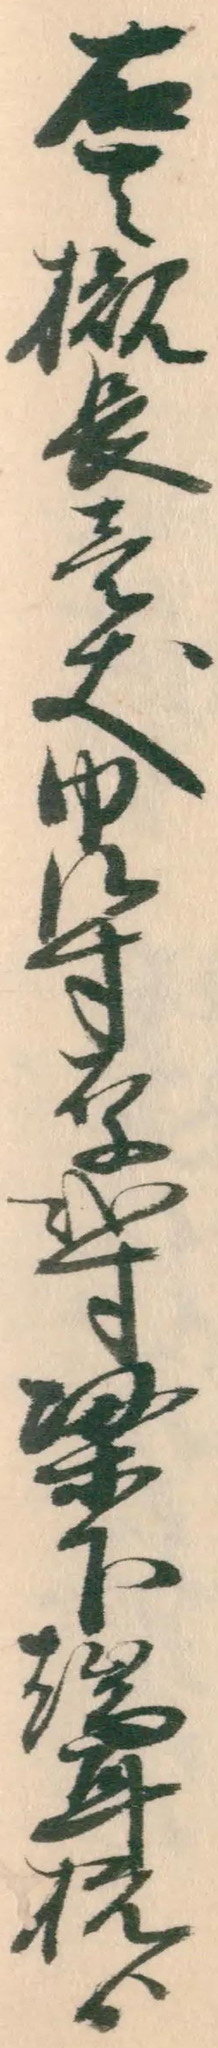右は槻長壱丈巾八寸厚弐寸梁下端耳杭ゟ
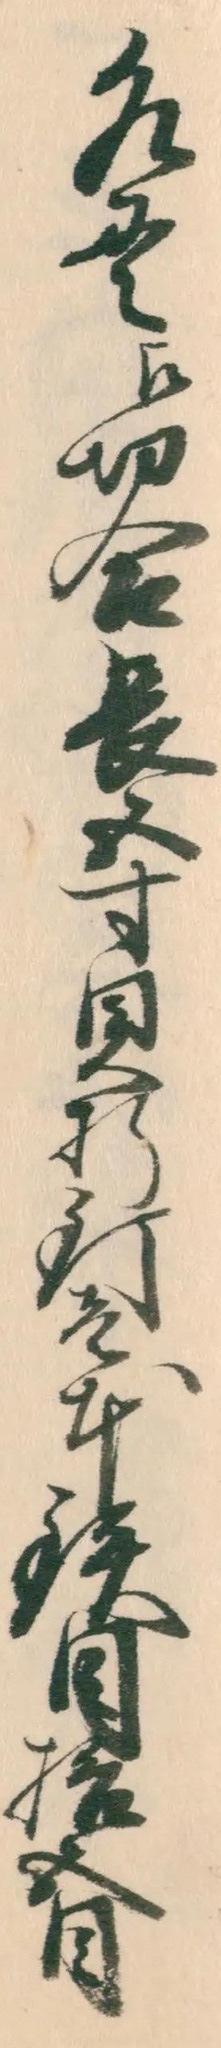水貫え切合長五寸貝折釘壱本鉄目拾五目
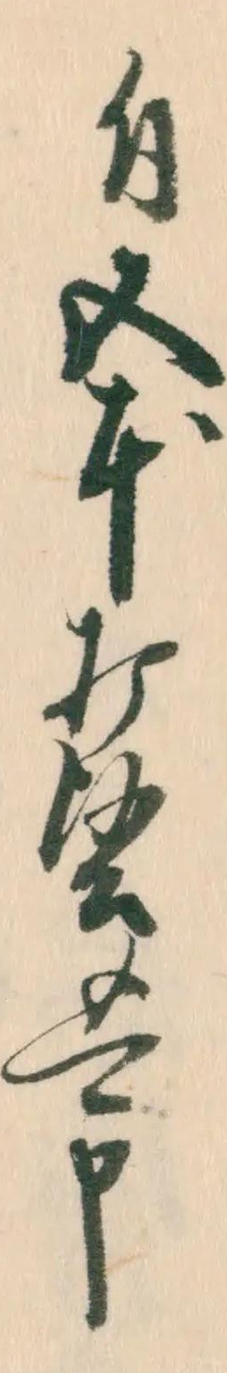付五本打堅メ可申
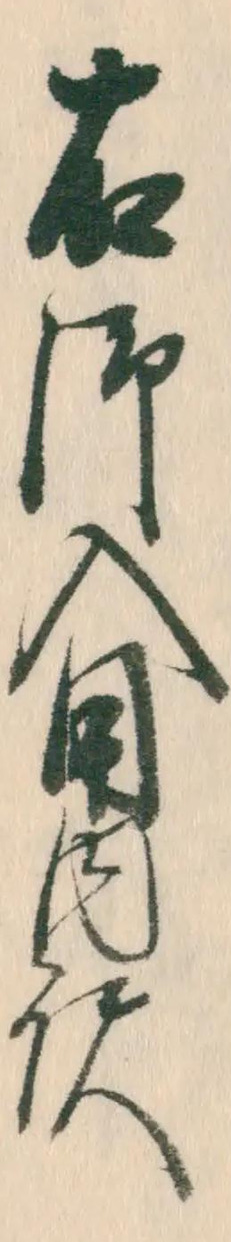右御入用内訳
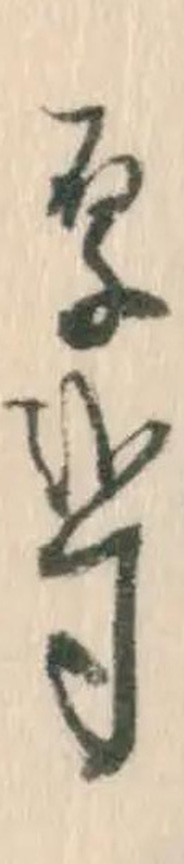厚弐寸
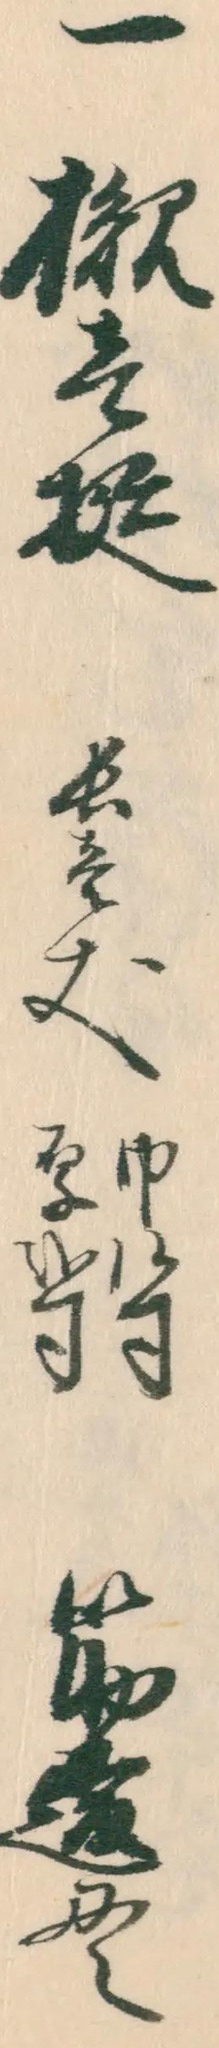一槻壱挺長壱尺巾八寸筋違貫
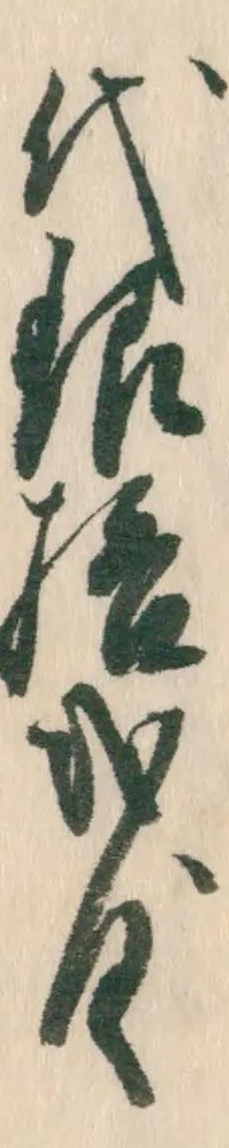代銀拾弐匁
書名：三橋 17巻. [8] 三橋小破御修復書留　但御奉行御掛リ替地震潰橋番屋　嘉永四亥年より安政二卯年迄　下
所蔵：国立国会図書館 National Diet Library, JAPAN
